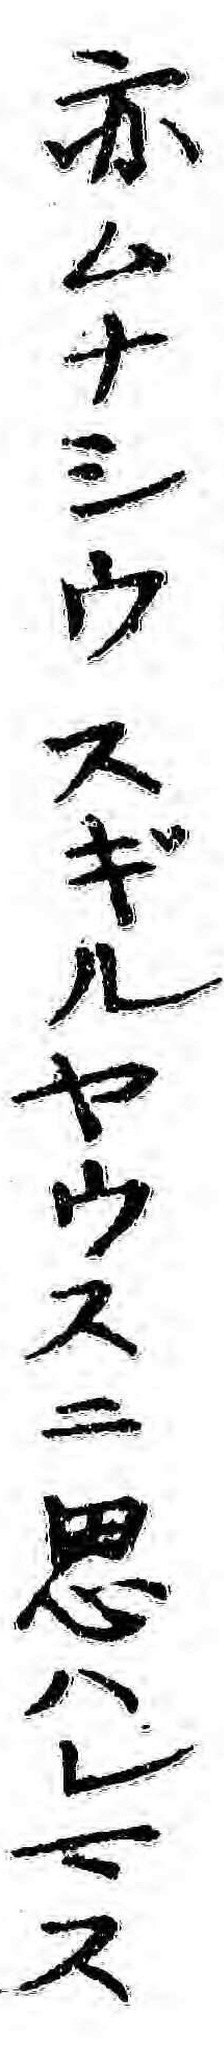亦ムナシウスギルヤウスニ思ハレマス
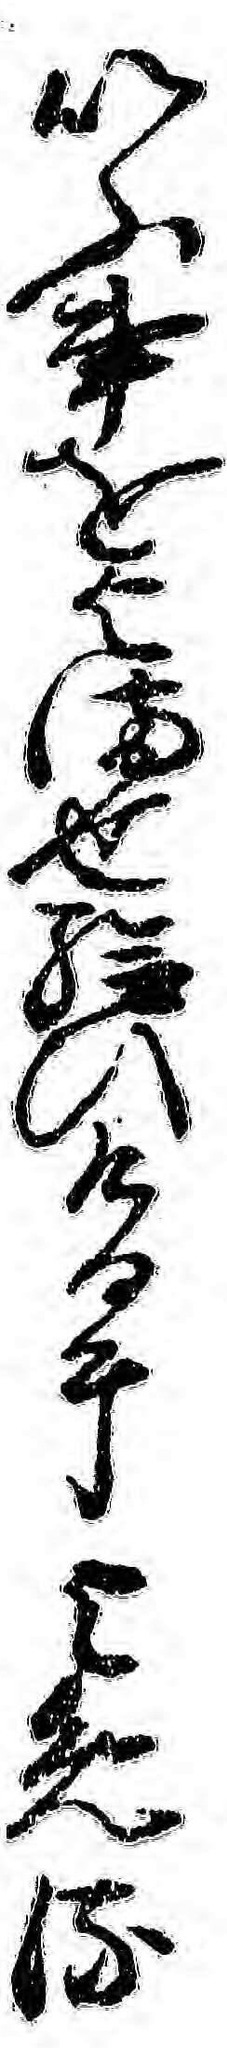いふ事をよませ給ひけるによめる
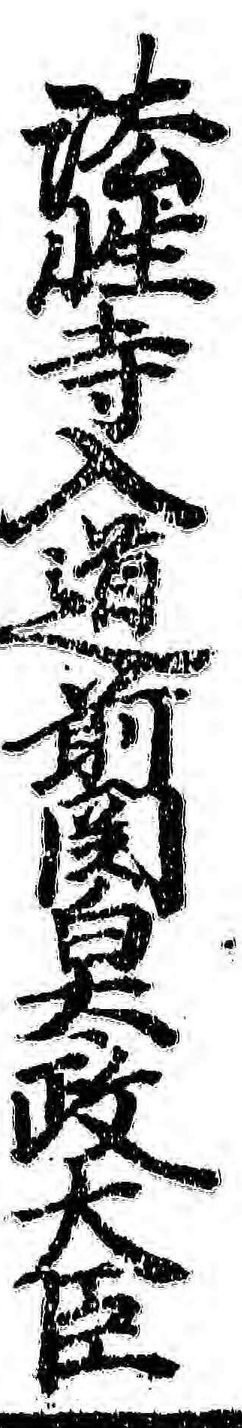法性寺入道前関白太政大臣
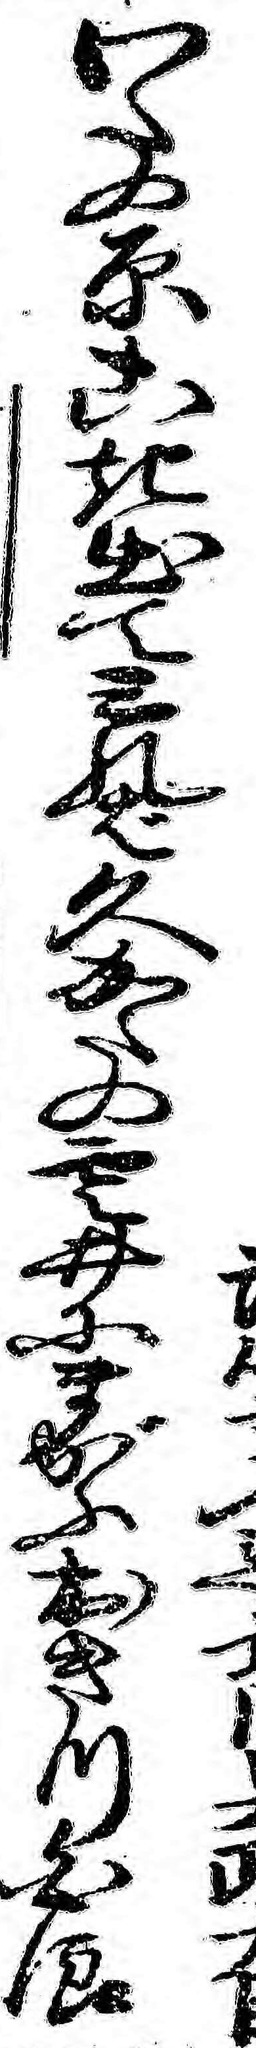わたの原こぎ出てみれば久かたの雲ゐにまがふおきつ白浪
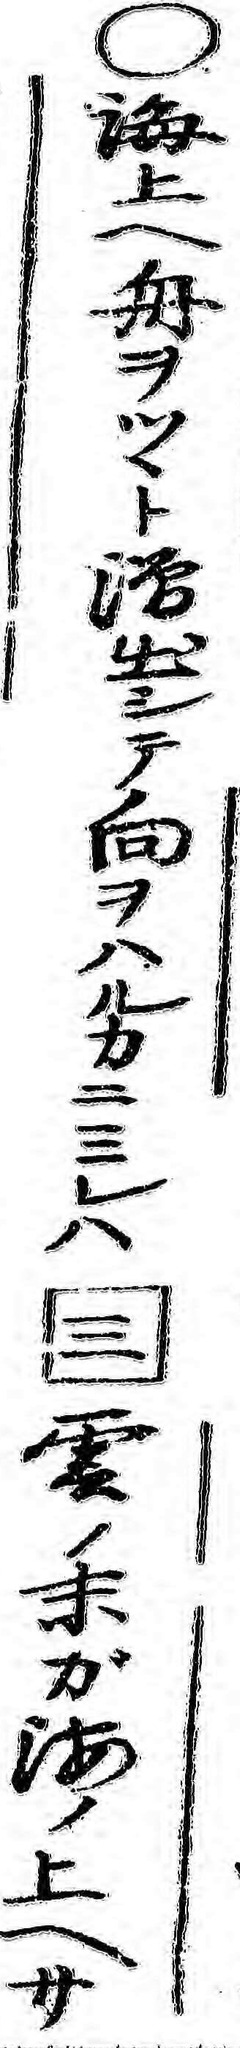○海上ヘ舟ヲツヽト漕出シテ向ヲハルカニミレハ三雲ノ末ガ海ノ上ヘサ
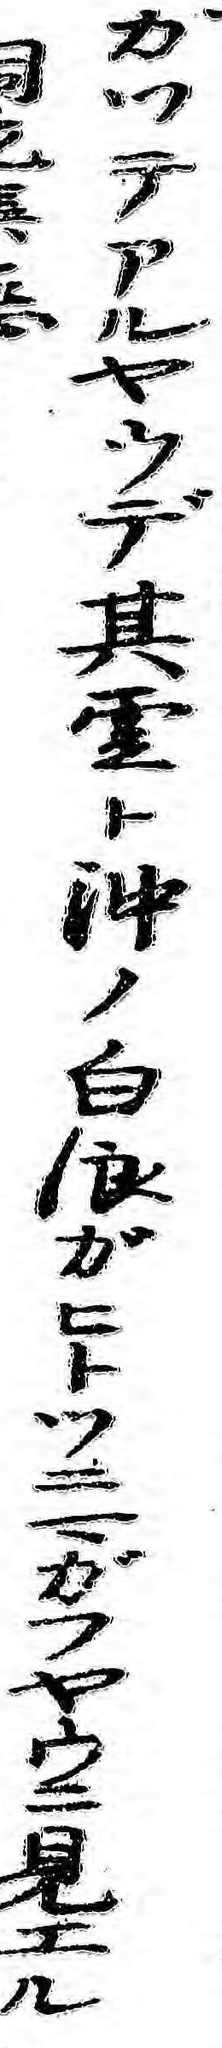ガツテアルヤウデ其雲ト沖ノ白浪ガヒトツニマガフヤウニ見エル
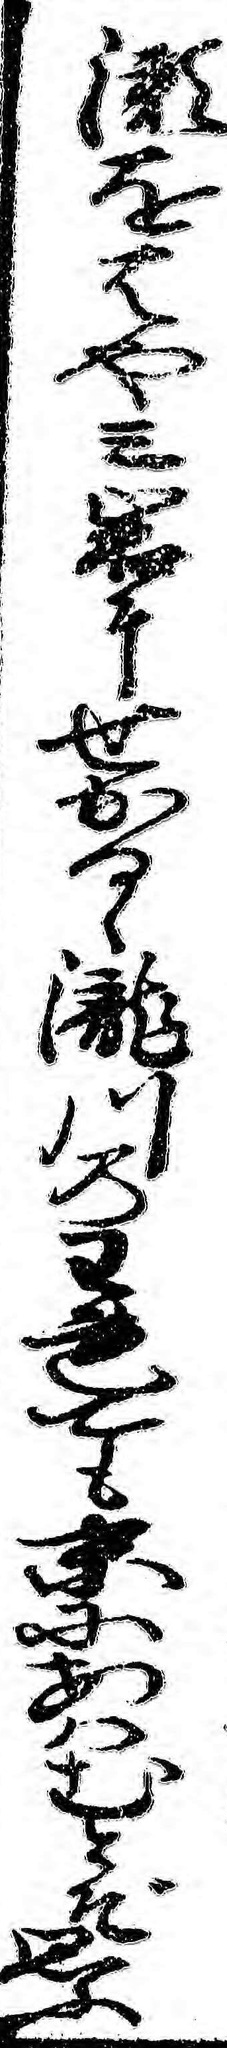瀬をはやみ岩にせかるゝ瀧川のわれても末にあはむとぞ思ふ
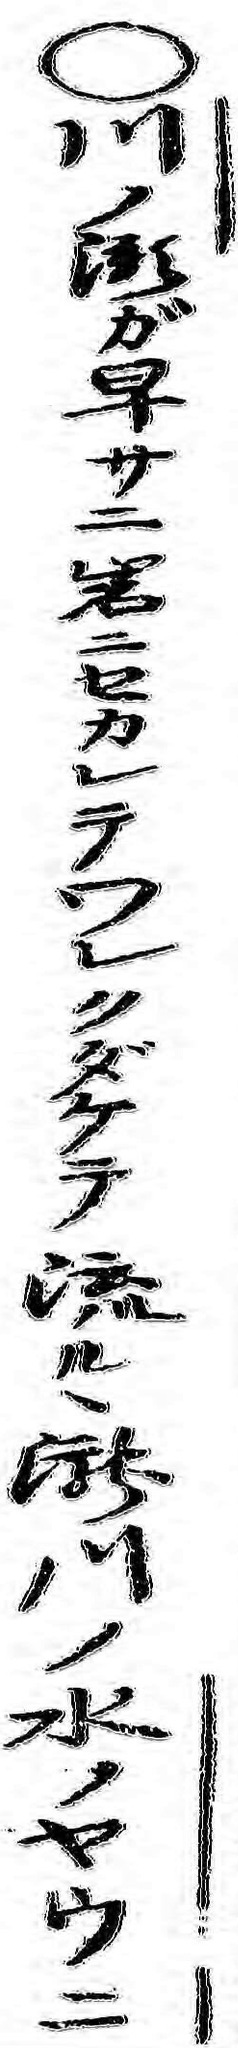○川ノ瀬ガ早サニ岩ニセカレテワレクダケテ流ルヽ滝川ノ水ノヤウニ
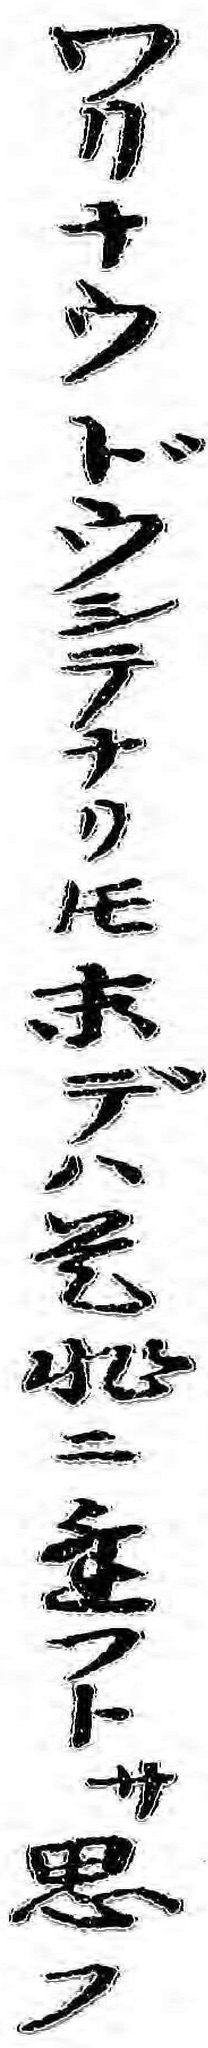ワリナウドウシテナリトモ末デハ是非ニ逢フトサ思フ
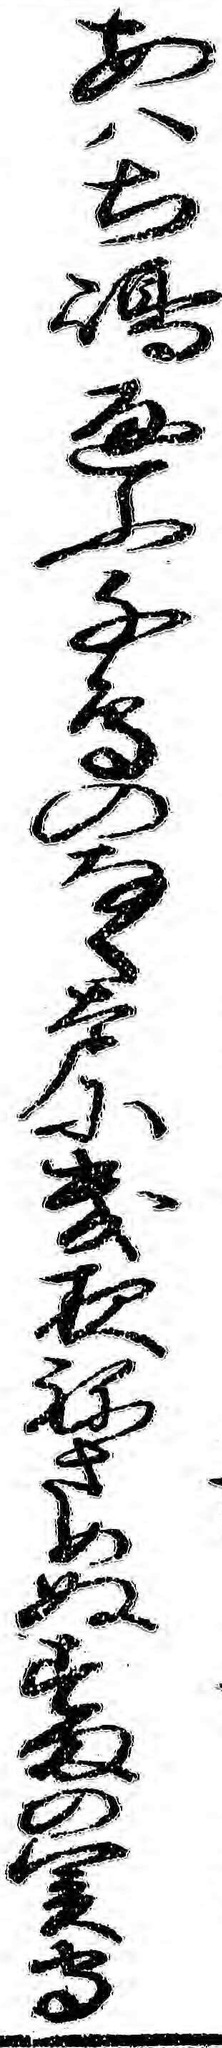あはち嶋通ふ千鳥のなく声に幾夜ねざめぬすまの関守
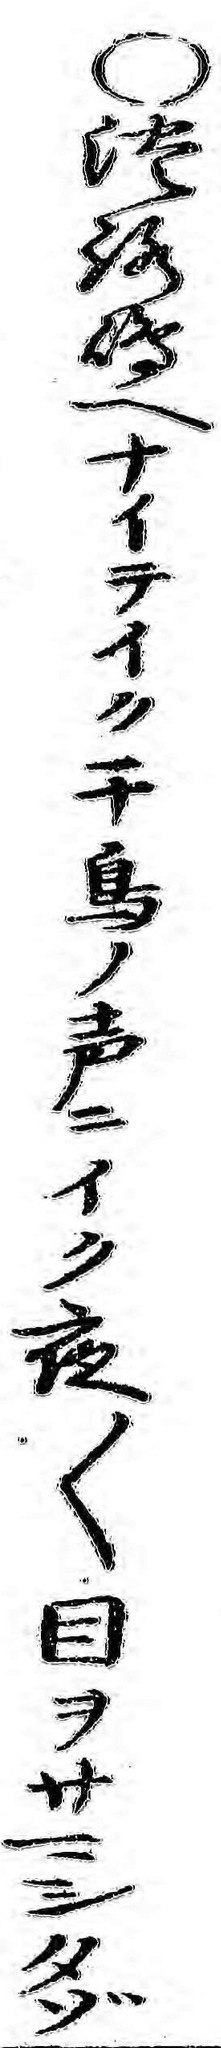○淡路嶋ヘナイテイク千鳥ノ声ニイク夜〳〵目ヲサマシタゾ
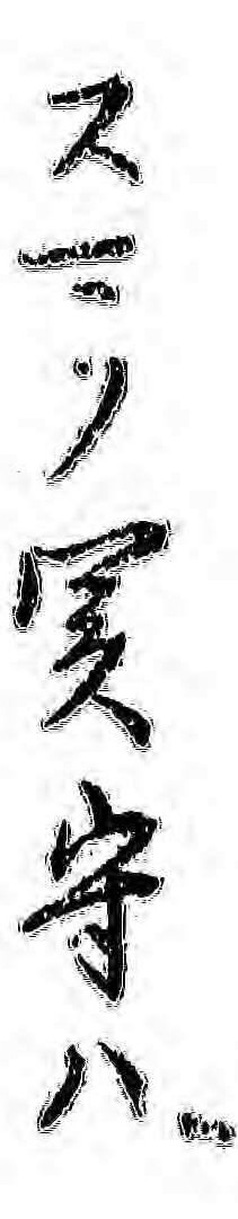スマノ関守ハ
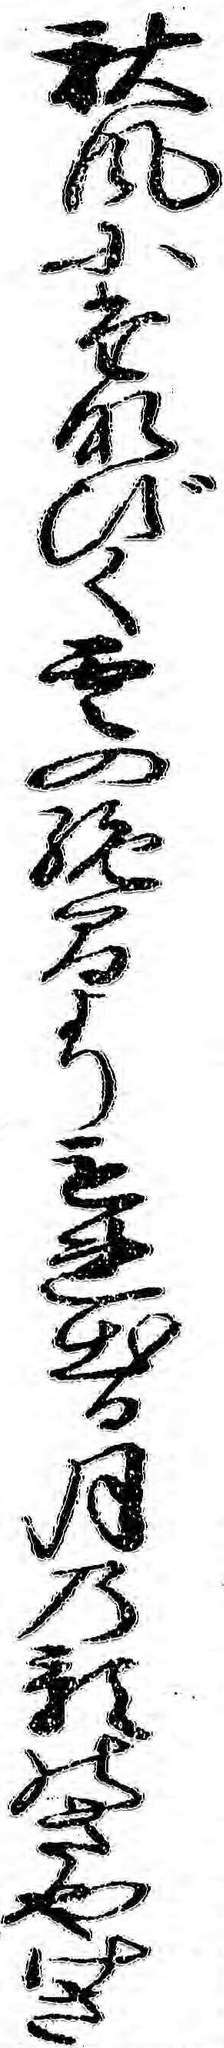秋風にたなびく雲の絶間よりもれ出る月の影のさやけさ
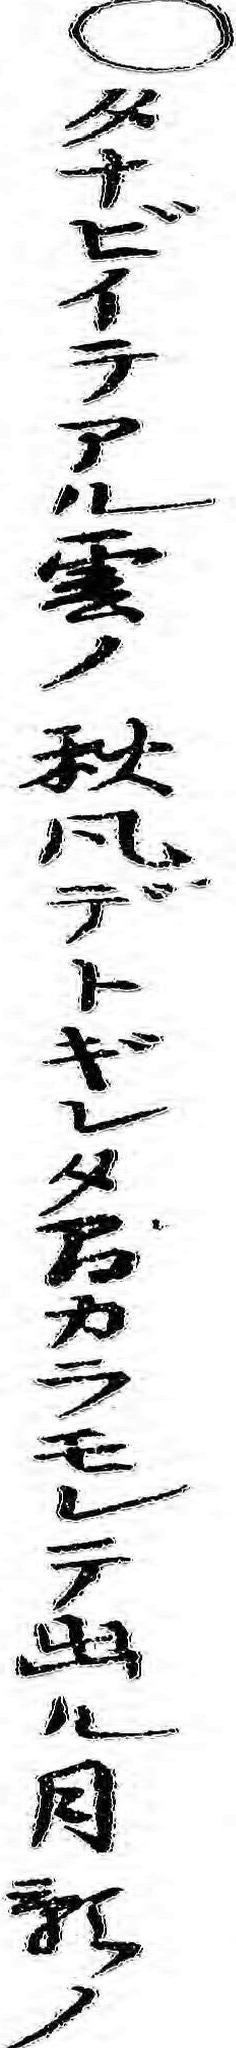○タナビイテアル雲ノ秋風デトギレタ間カラモレテ出ル月影ノ

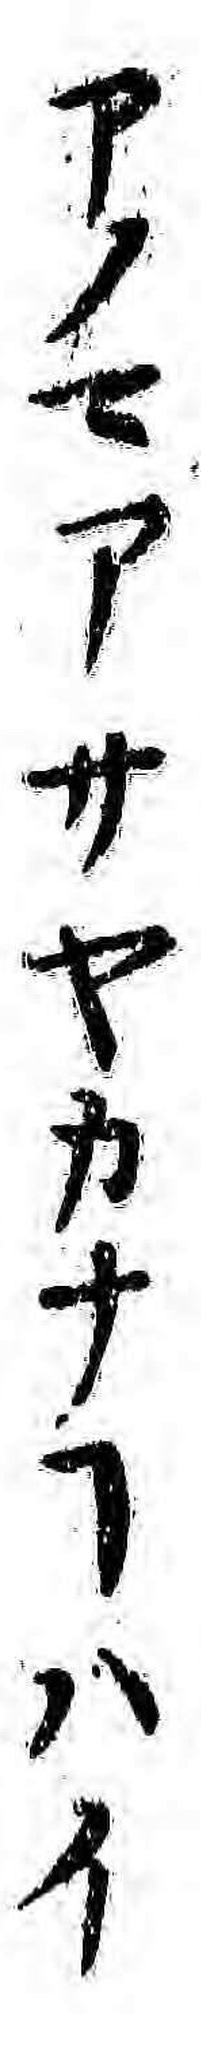アノマアサヤカナコトハイ
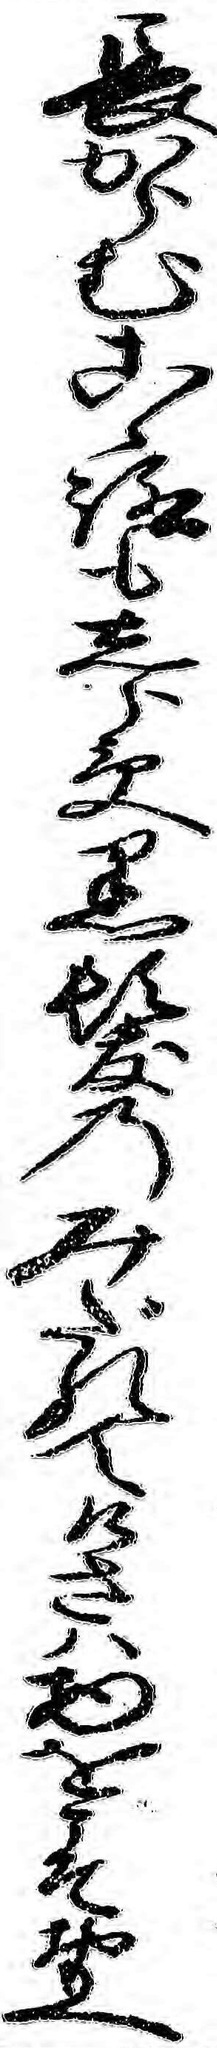長からむこゝろも知らず黒髪のみだれてけさは物をこそおもへ
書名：百人一首／小倉の山ふみ
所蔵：国文学研究資料館
